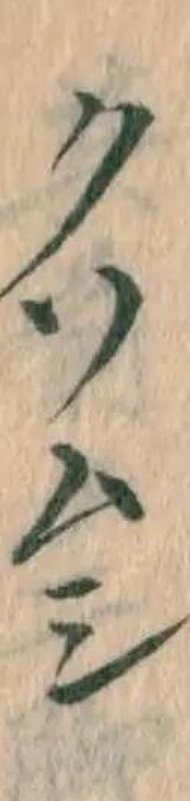クソムシ
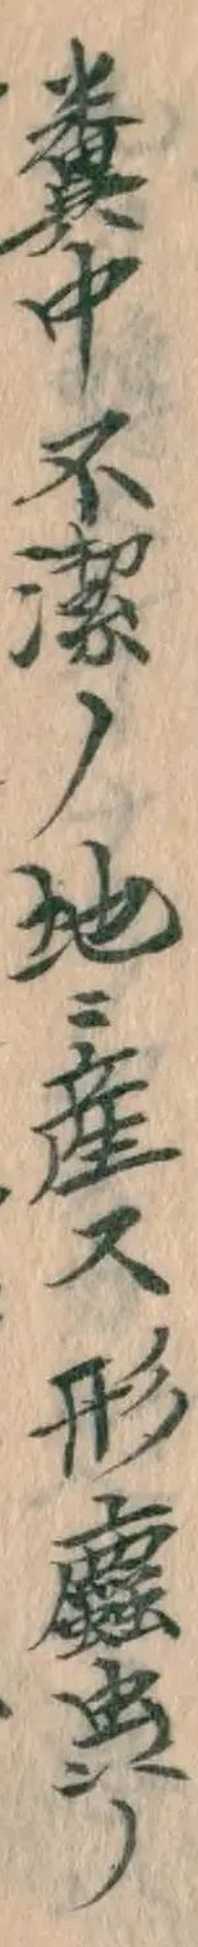糞中不潔ノ地ニ産ス形䗪蟲ノ
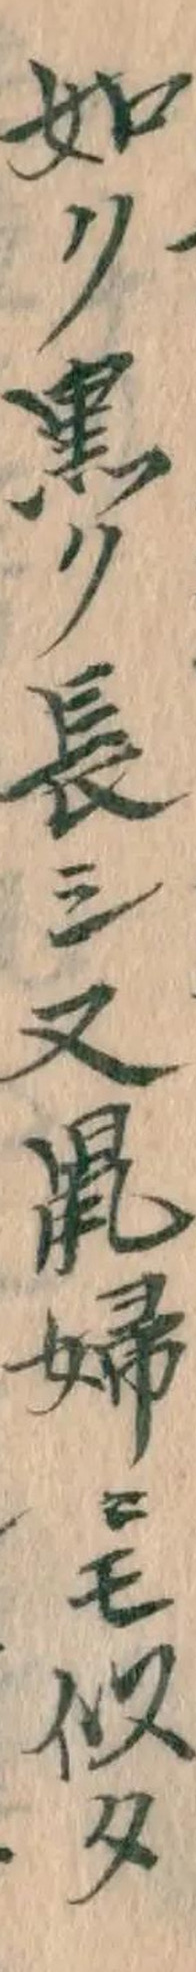如ク黒ク長シ又鼠婦ニモ似タ
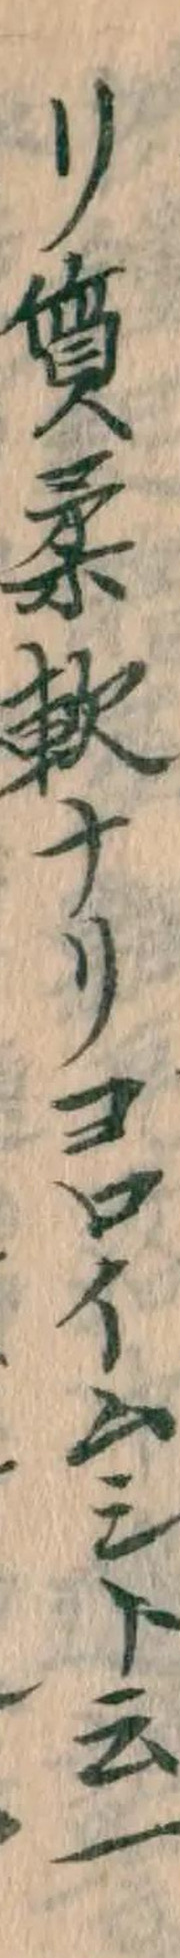リ質柔軟ナリヨロイムシト云一
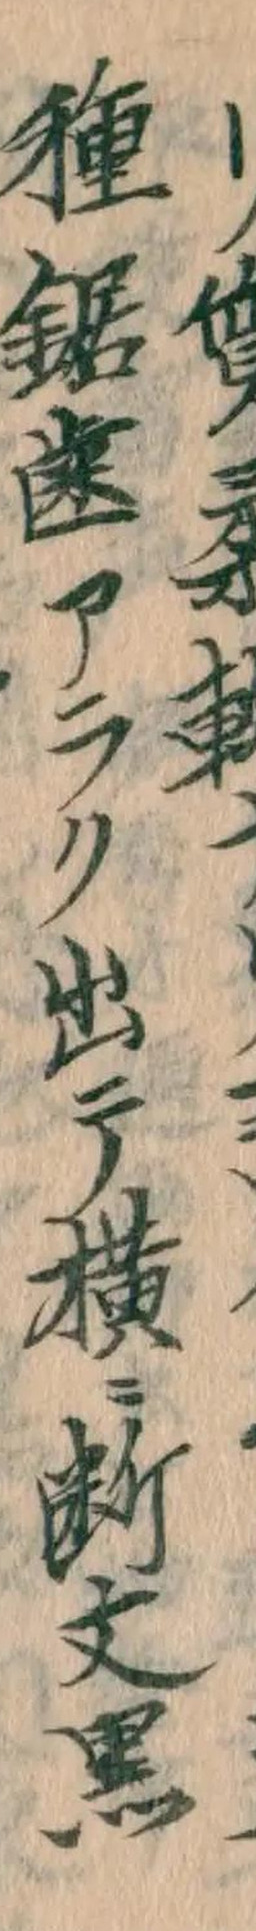種鋸歯アラク出テ横ニ断文黒
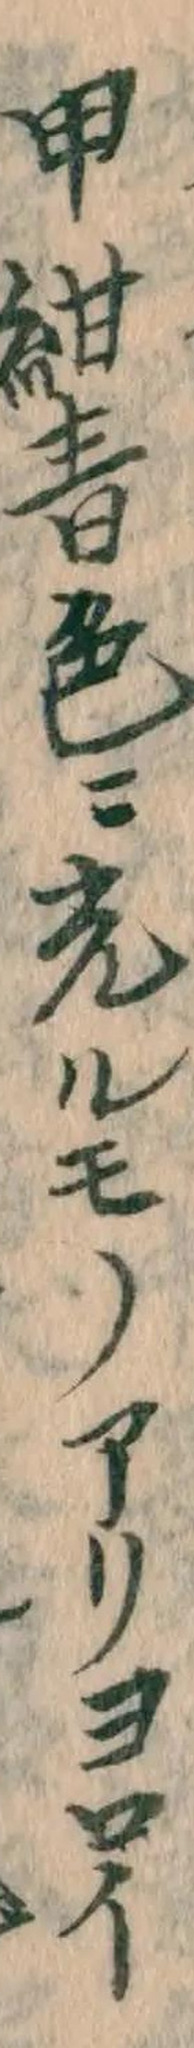甲紺青色ニ光ルモノアリヨロイ
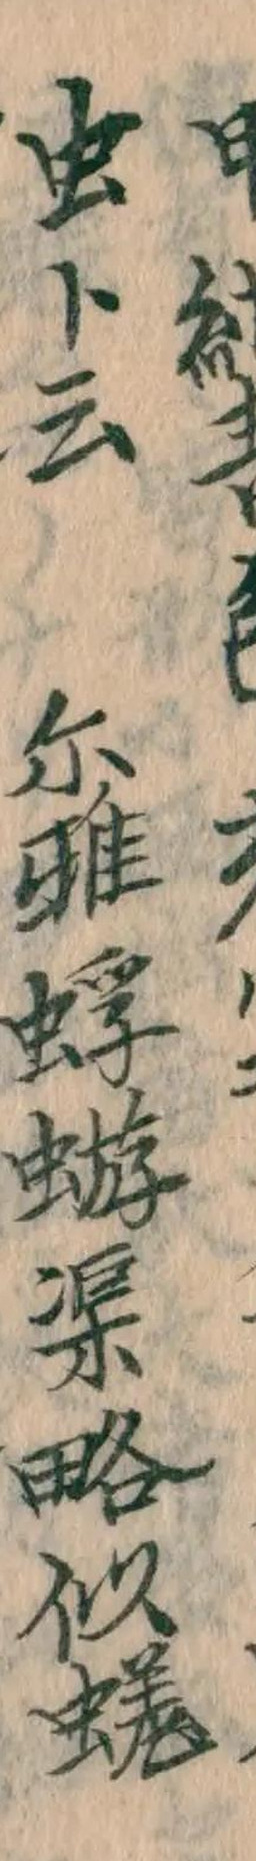虫ト云尓雅蜉蝣渠略似蜣
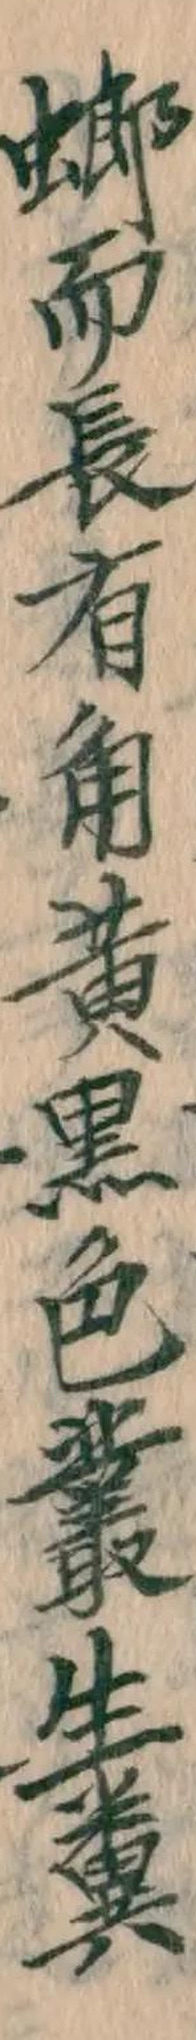蜋而長有角黄黒色叢生糞
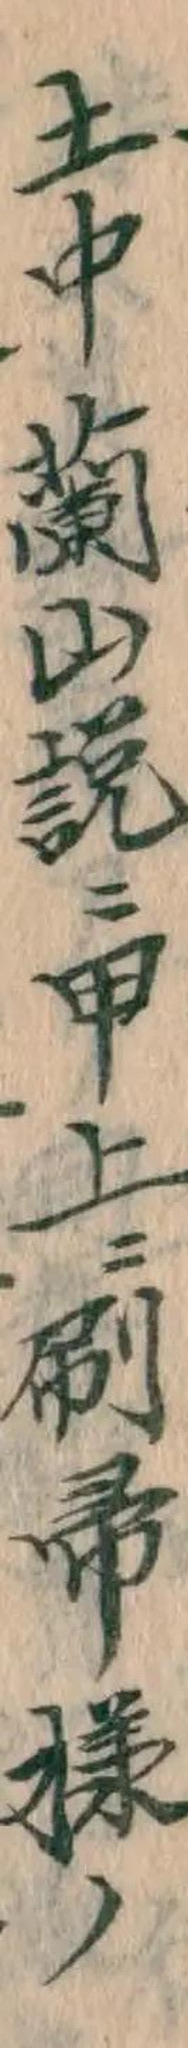土中蘭山説ニ甲上ニ刷帚様ノ
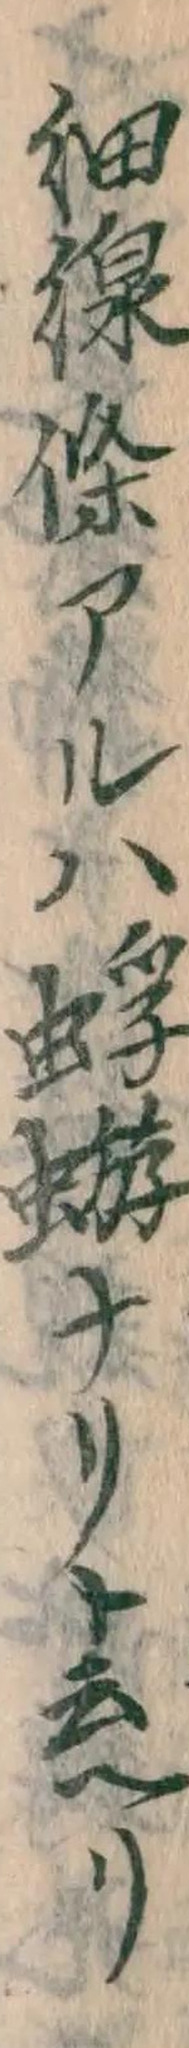細線條アルハ蜉蝣ナリト云ヘリ
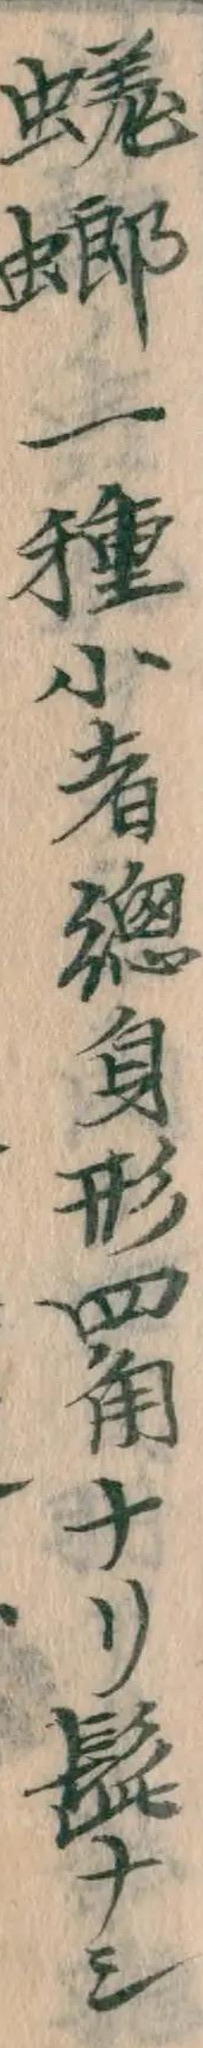蜣蜋一種小者総身形四角ナリ髭ナシ
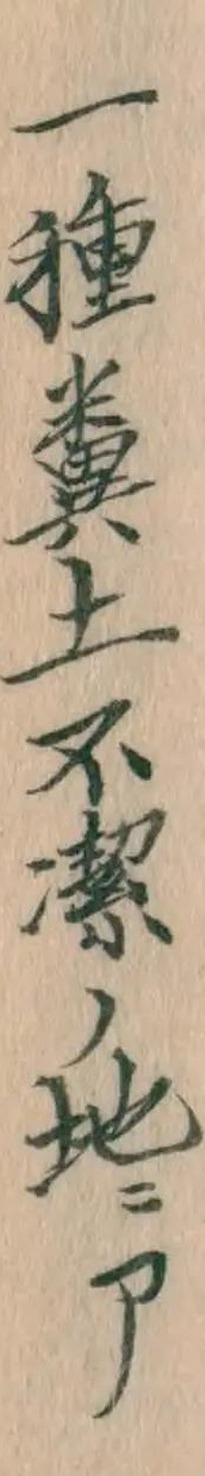一種糞土不潔ノ地ニア
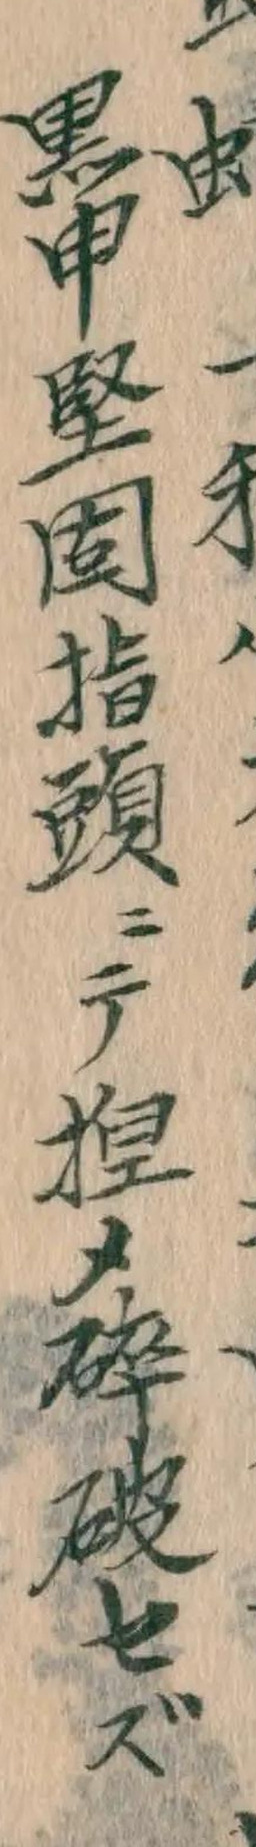黒甲堅固指頭ニテ揑シテ砕破セズ
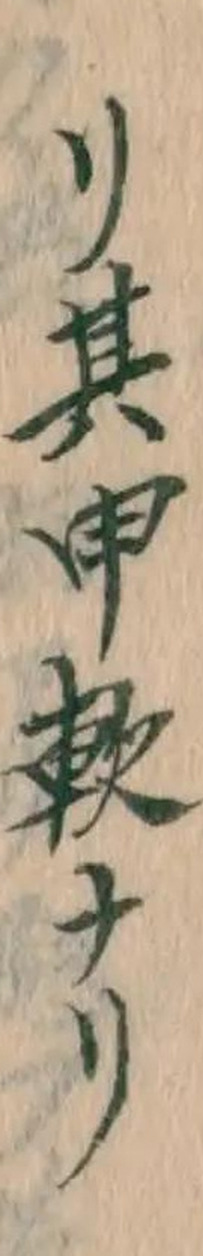リ其甲軟ナリ
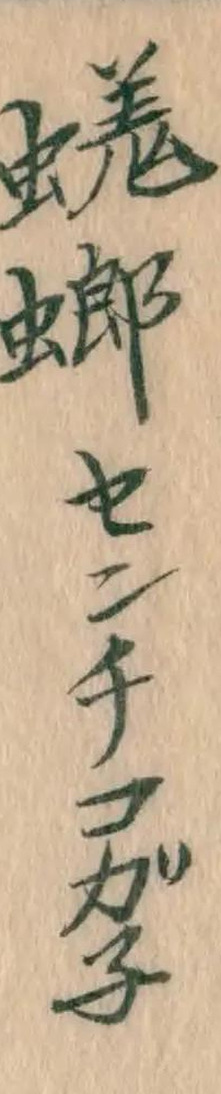蜣蜋センチコガネ
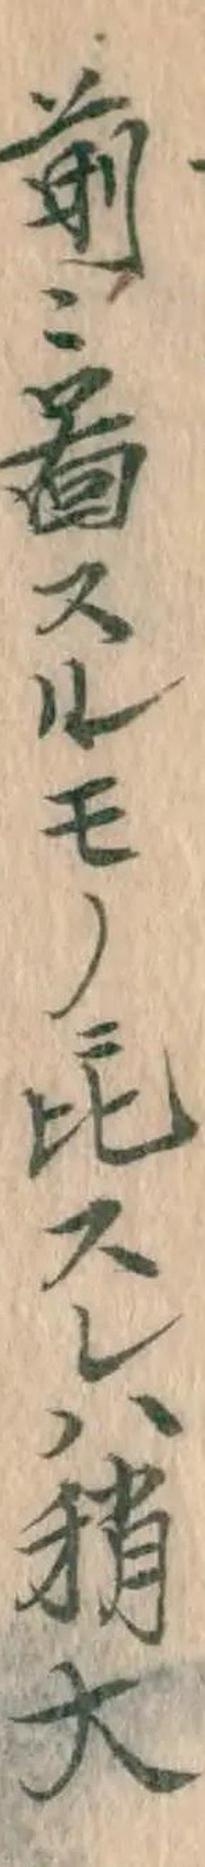前ニ図スルモノニ比スレハ稍大
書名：千蟲譜 3巻. [3]
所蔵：国立国会図書館 National Diet Library, JAPAN
